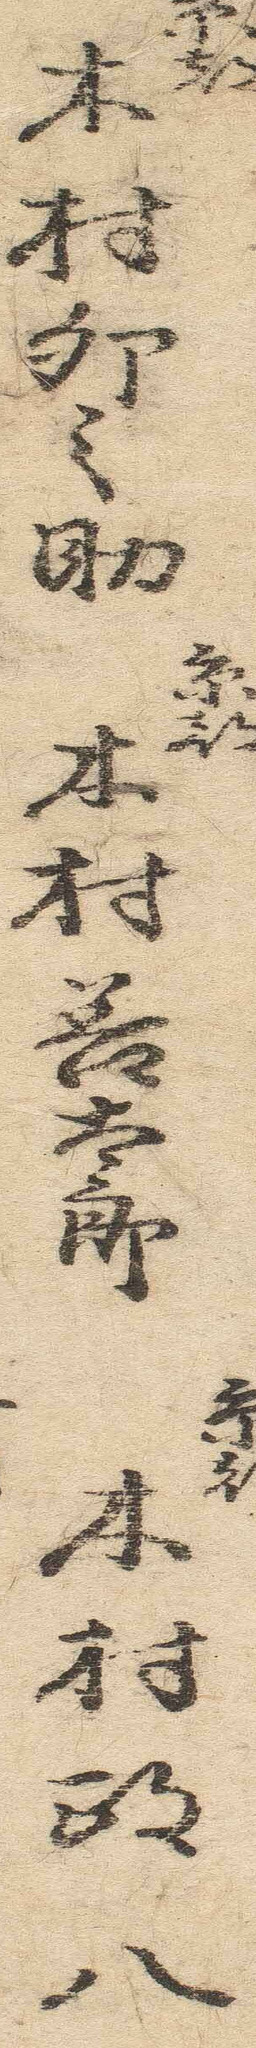木村卯之助木村善太郎木村政八
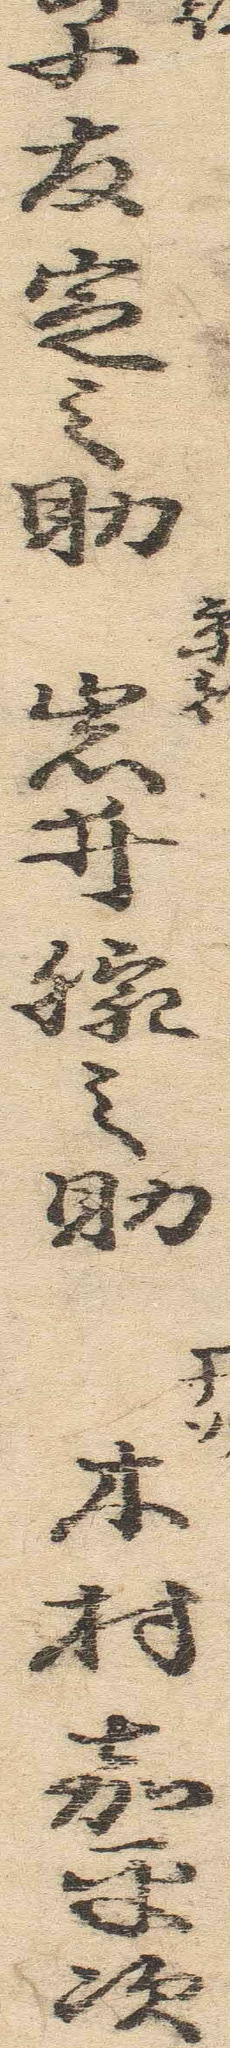早友定之助岩井腕之助木村嘉平次
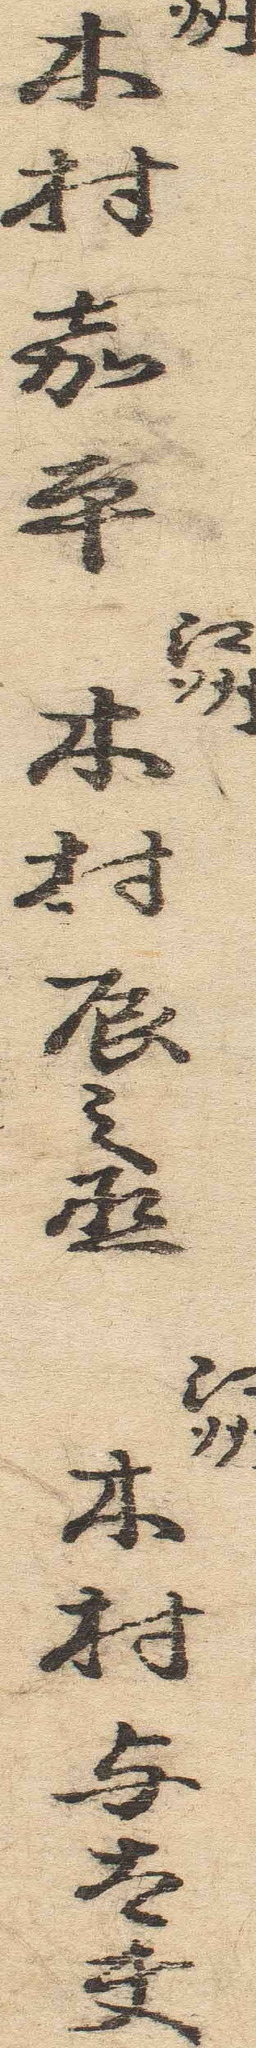木村嘉平木村辰之丞木村与太夫

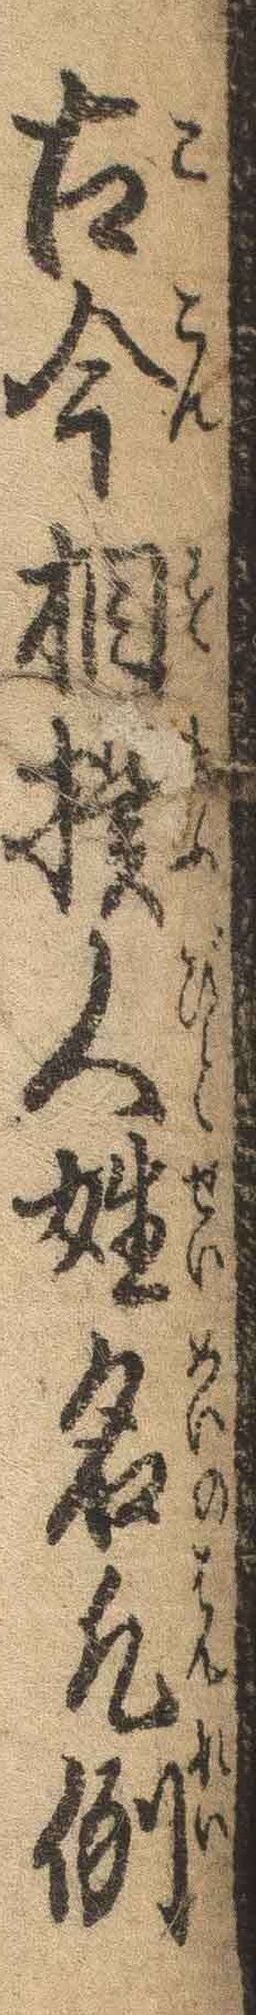古今相撲人姓名凡例
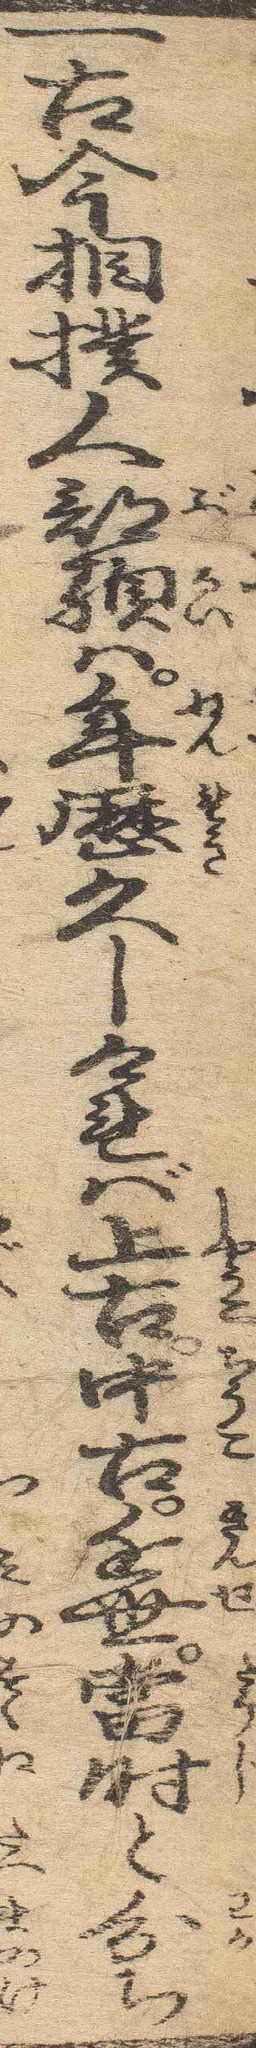一古今相撲人部類は。年歴久しければ上古。中古。近世。当時と分ち
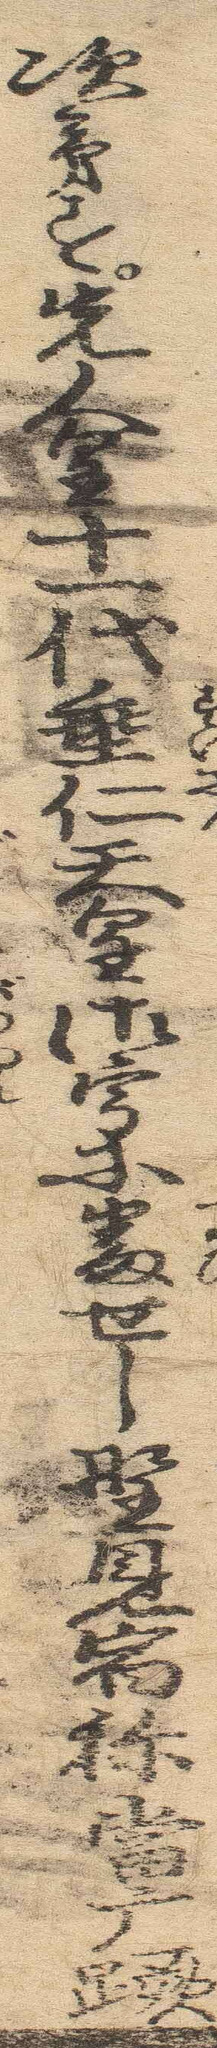次第す。先人皇十一代垂仁天皇御宇に番せし野見宿祢当广蹴
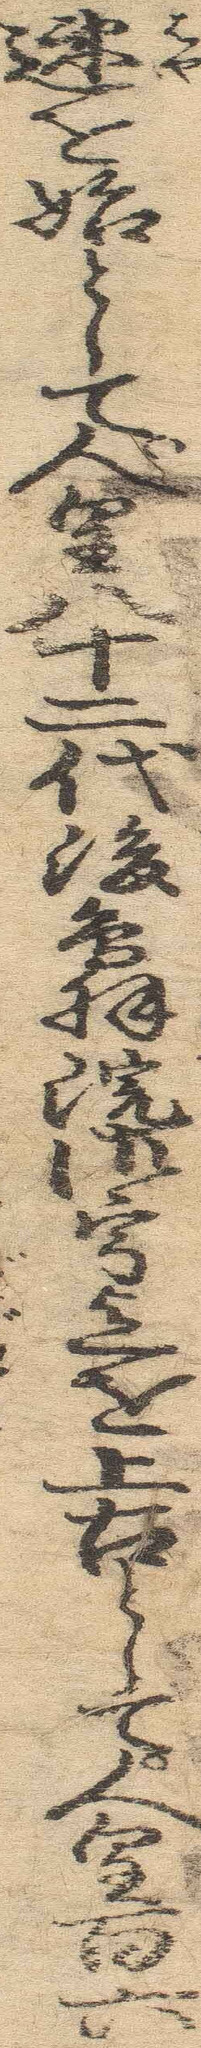速を始として。人皇八十二代後鳥羽院御宇迄を上古として。人皇百六
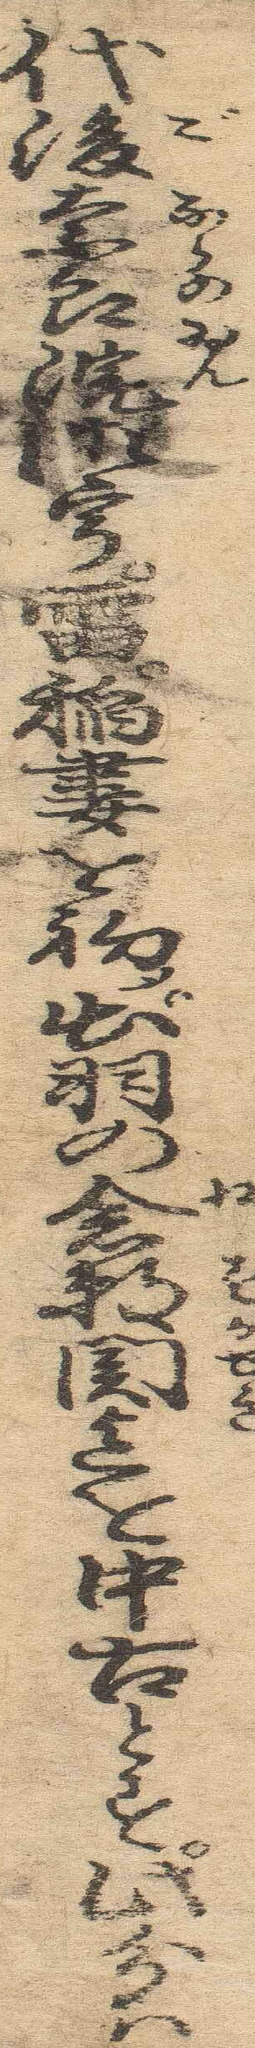代後奈良陰御宇。雷。稲妻を初。出羽の念数関迄を中古とす。此分は
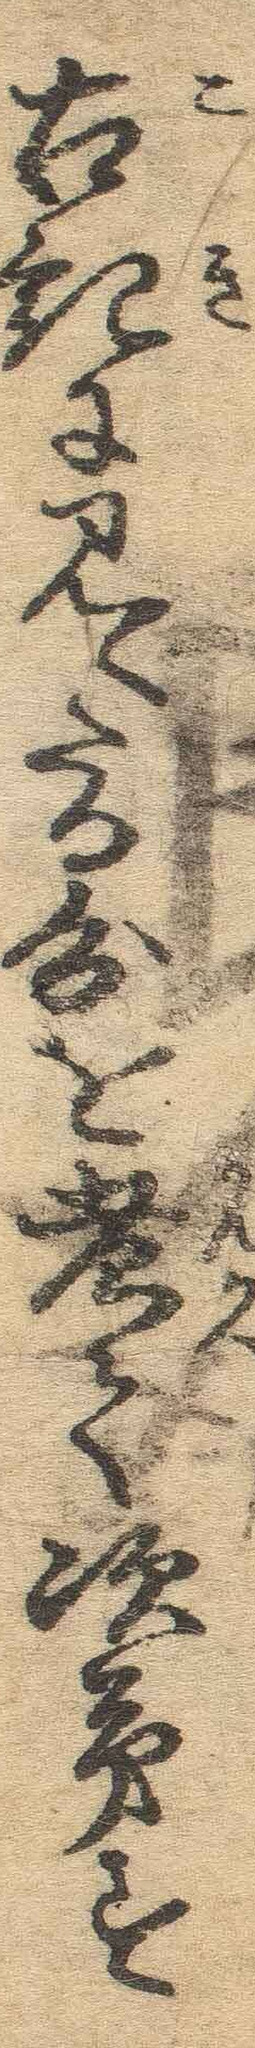古記に見へたる分を考て次第す
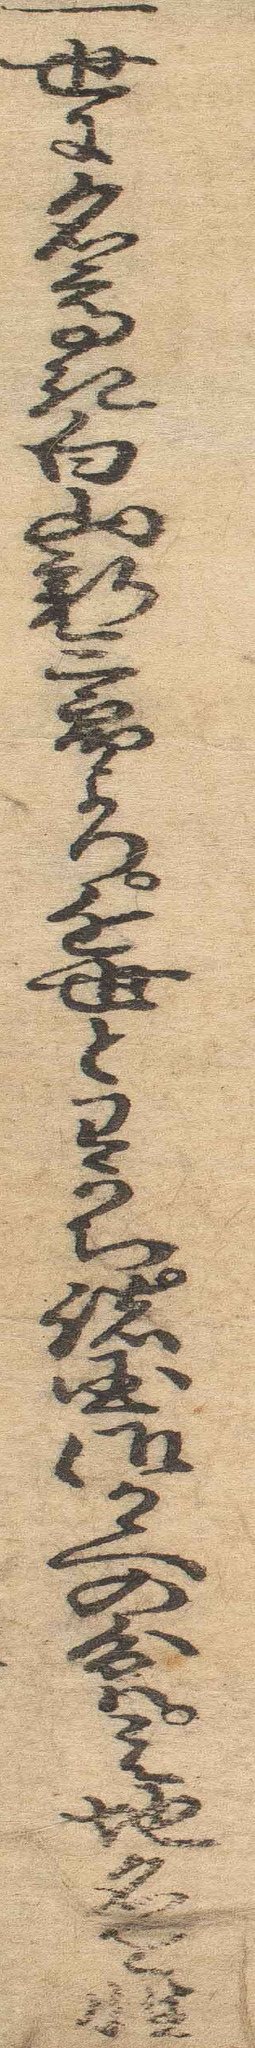一世に名高き白山新三郎より。近世とわかち。諸国御かゝへの分は。其地名を性
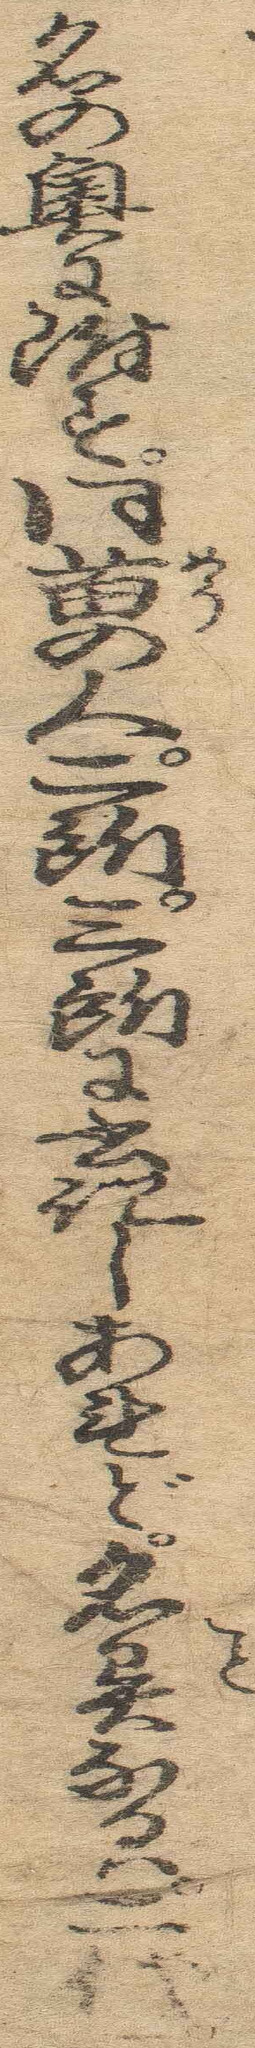名の奥に附す。同苗の人。二所。三所に書記しあれど。名異なるは。二代。三
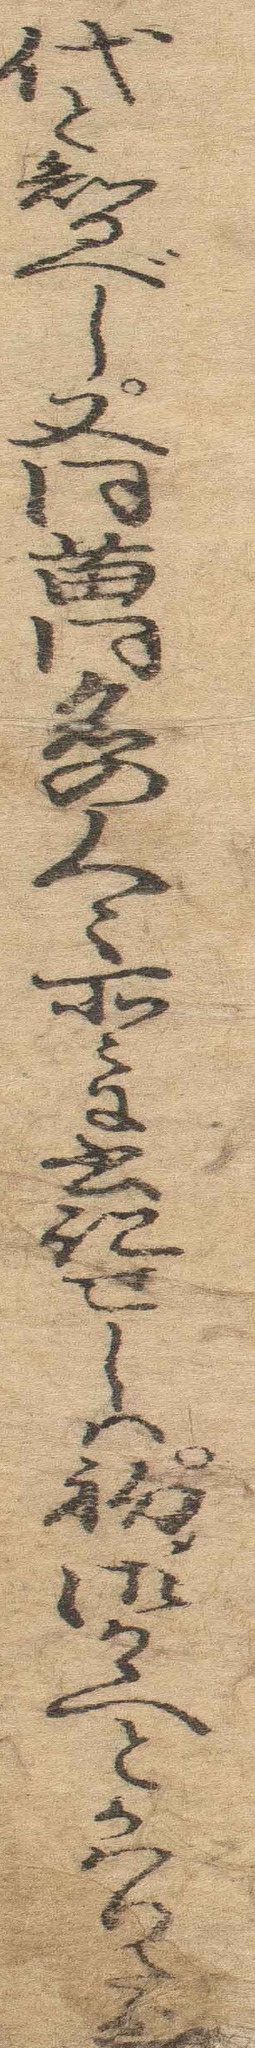代と知るべし。又同苗同名の人々所々に書記せしは。初御かゝへとかはりたる
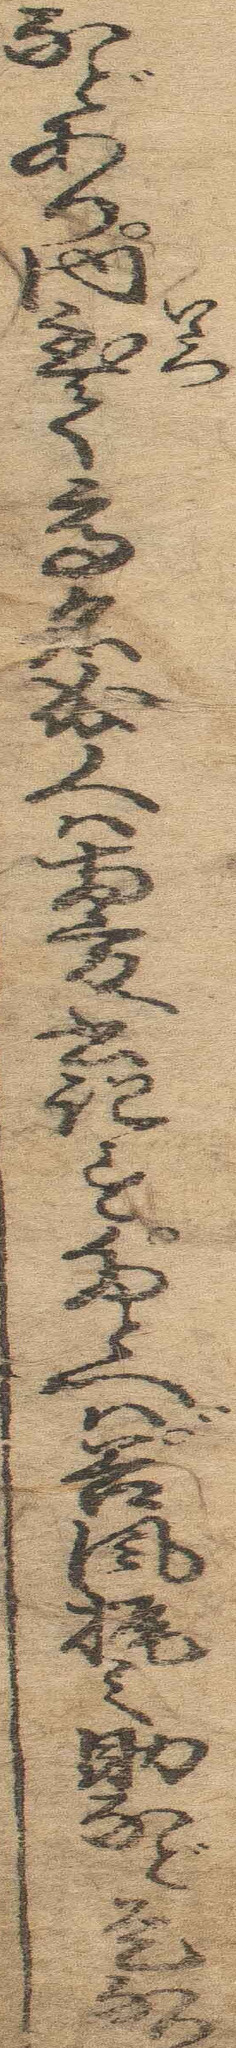などあり。内至て高名成人は両方へ書記す。たとへば。谷風梶之介など是なり

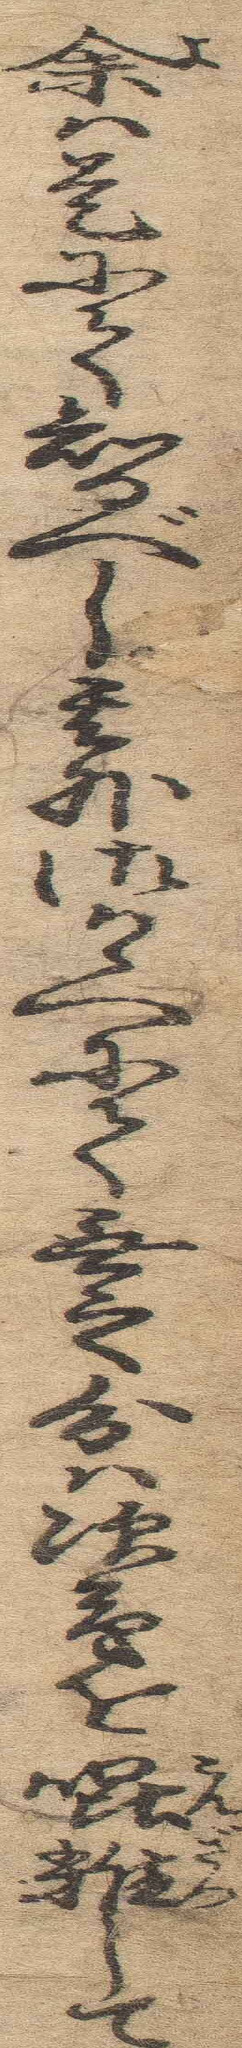余は是にて知るべし其外御かゝへにて無之分は次第を混雑して
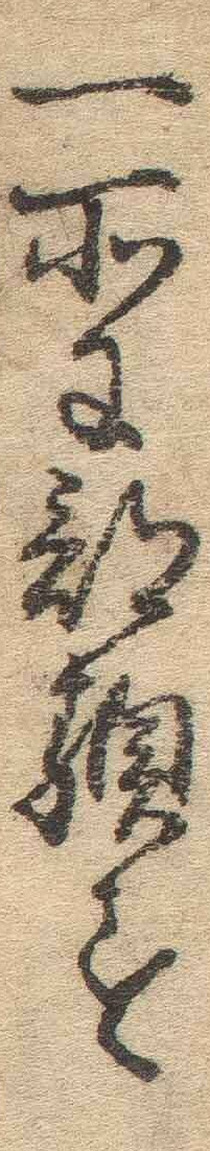一所に部類す
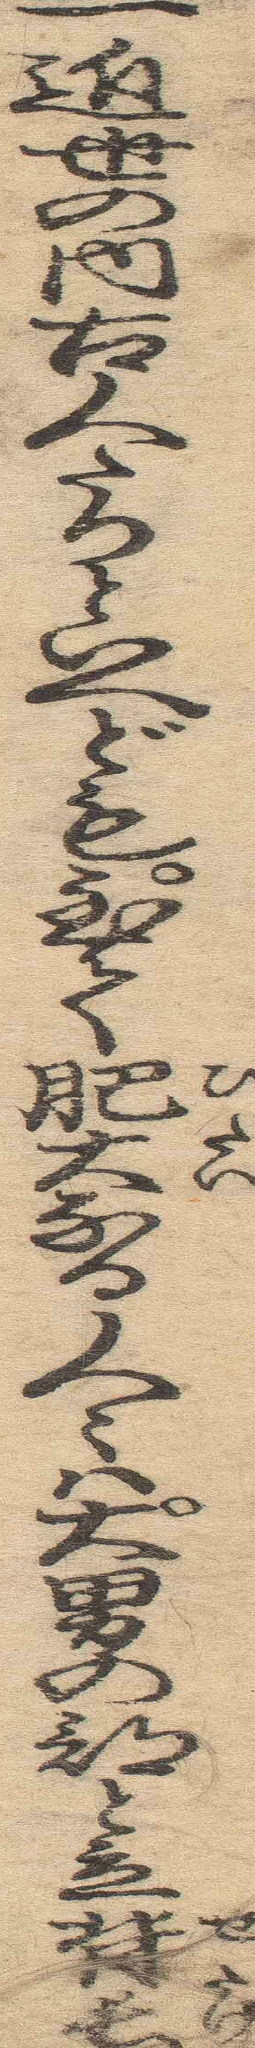一近世の内古人たりといへども。至て肥大なる人々は。大男の部と立背長
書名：古今相撲大全
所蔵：東京学芸大学附属図書館 国文学研究資料館
